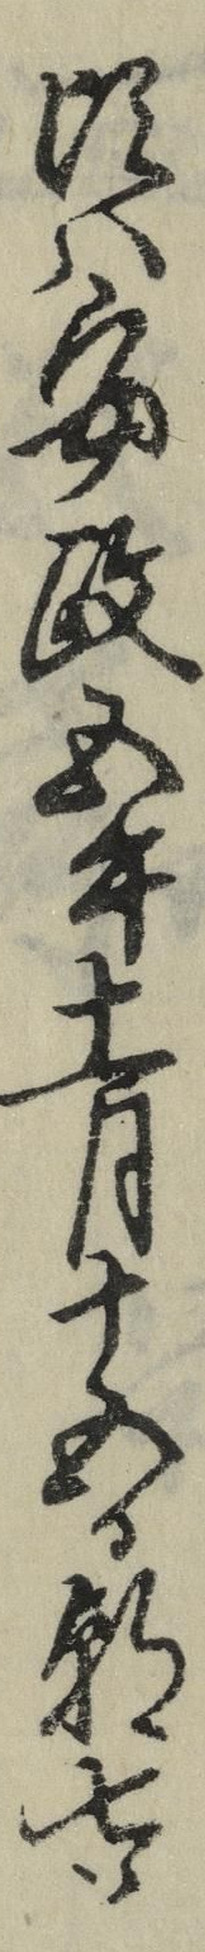頃は安政五午十一月十五日朝七ツ
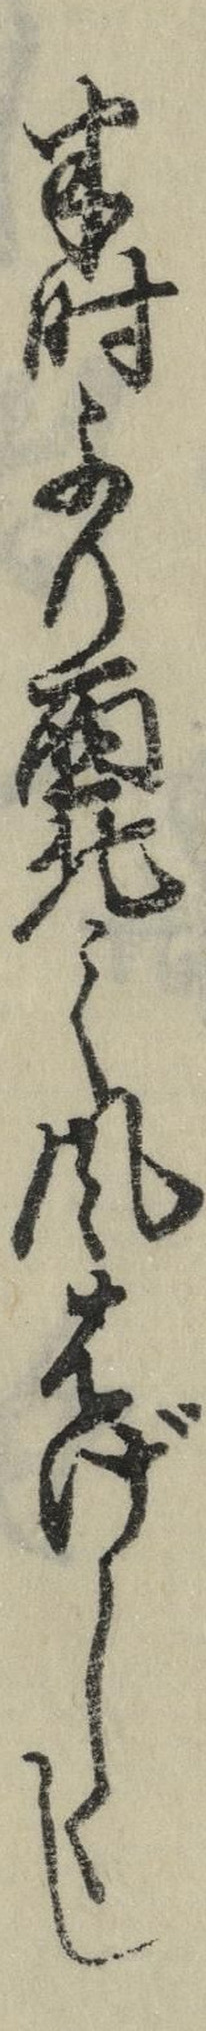半時より西北之風はげしくし
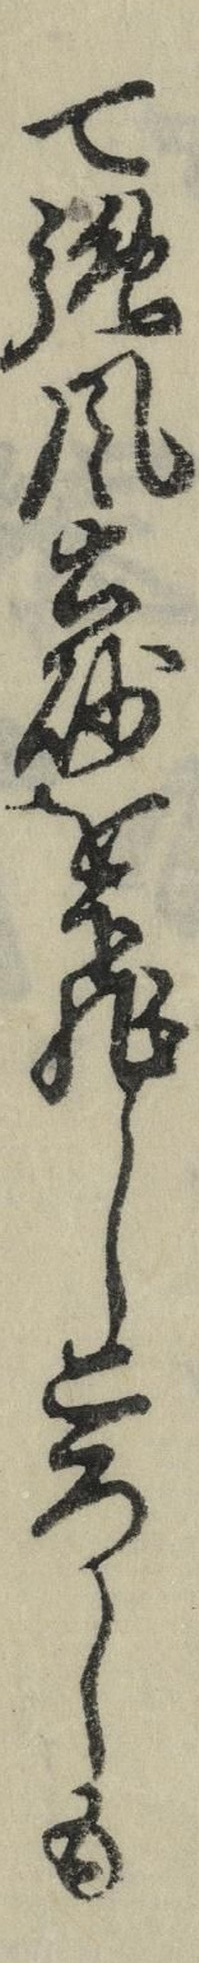て強風土砂を飛しころしも
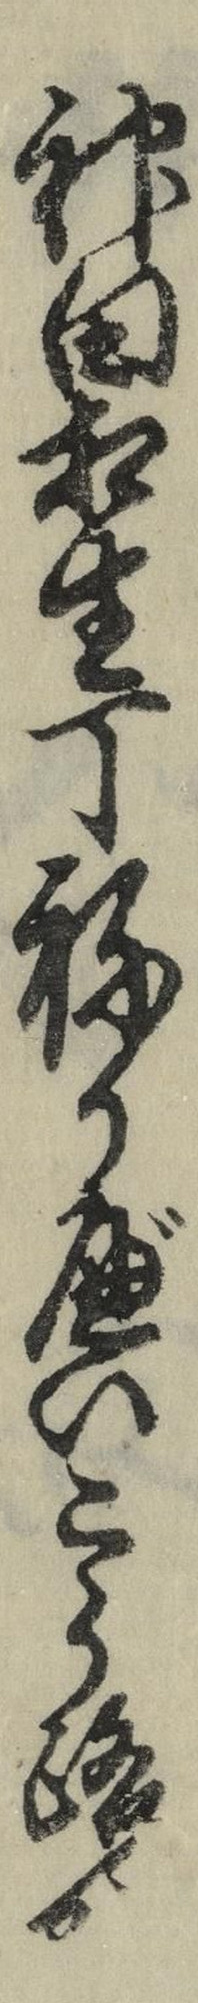神田相生丁ねりべいこう路ゟ
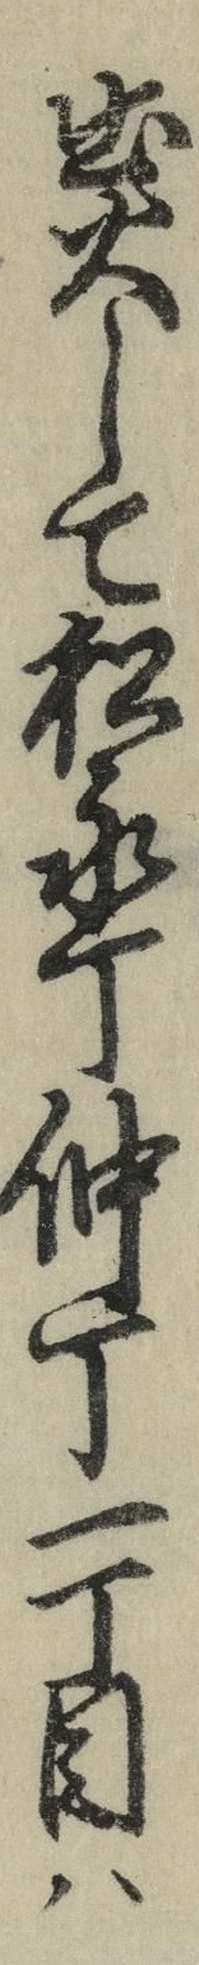出火して松永丁仲丁一丁目は
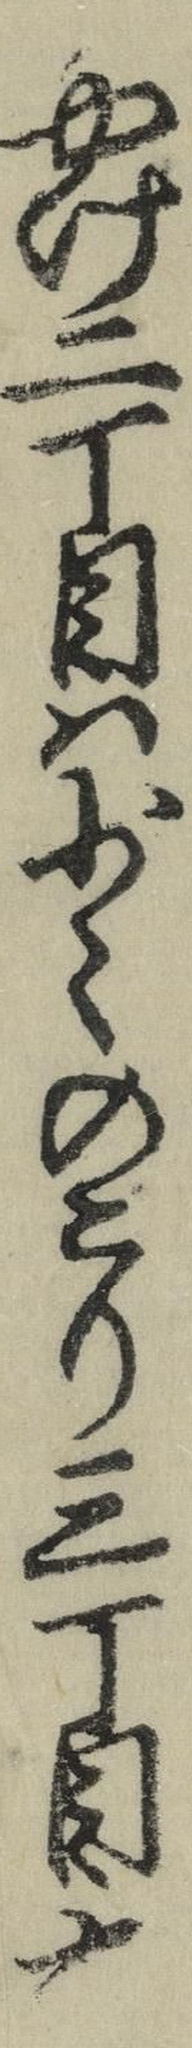やけ二丁目は少々のこり三丁目六

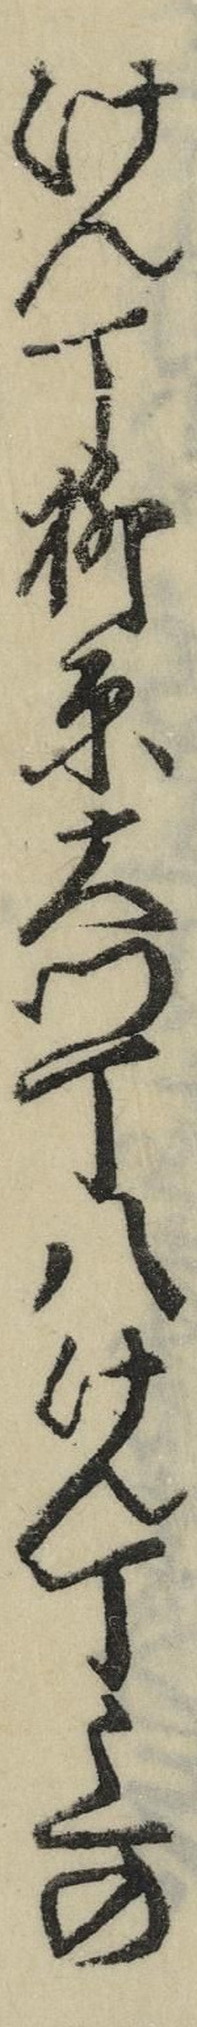けん丁柳原大門八けん丁上の
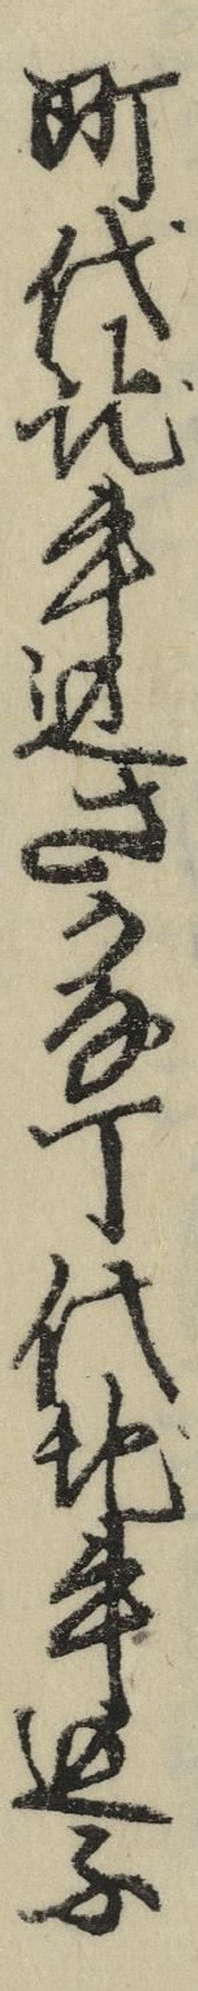町代地牛込さかな丁代地牛込ふ
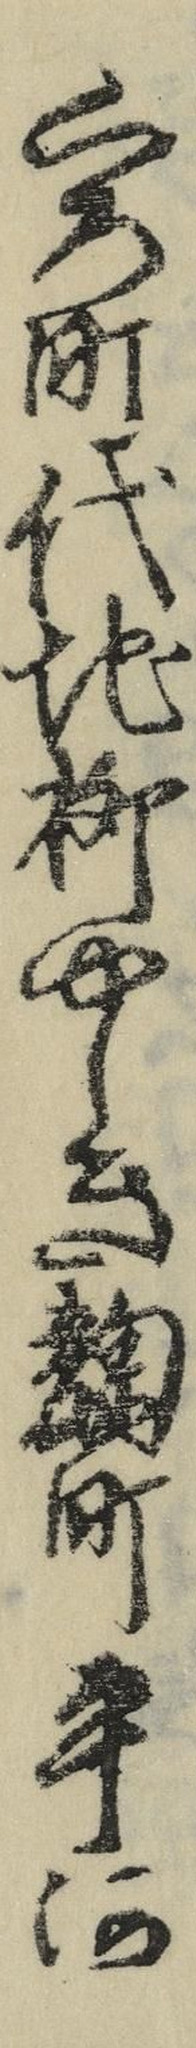くろ町代地柳やしき麹町平河
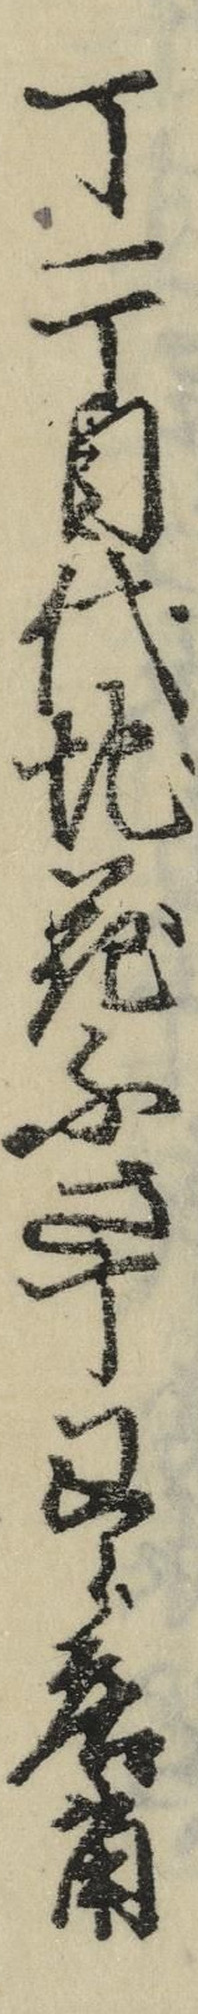丁一丁目代地花ふさ丁わら店角
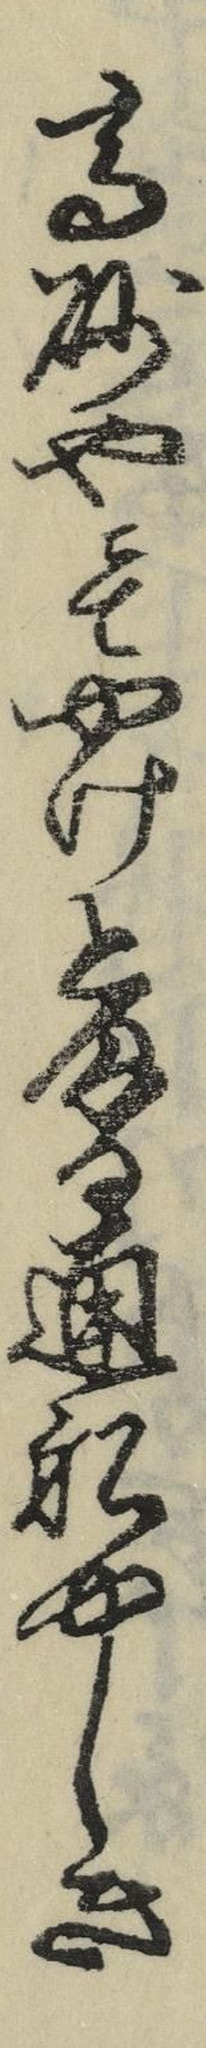高砂やにてやけとまる通船やしき
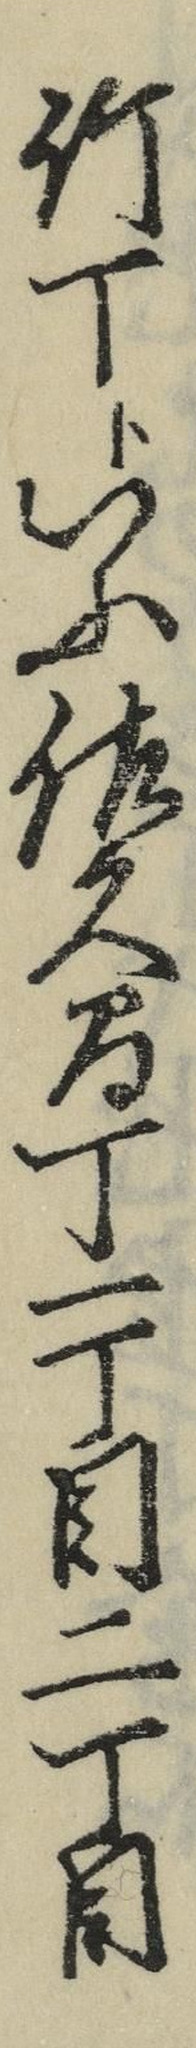竹丁トいふ佐久間丁一丁目二丁目
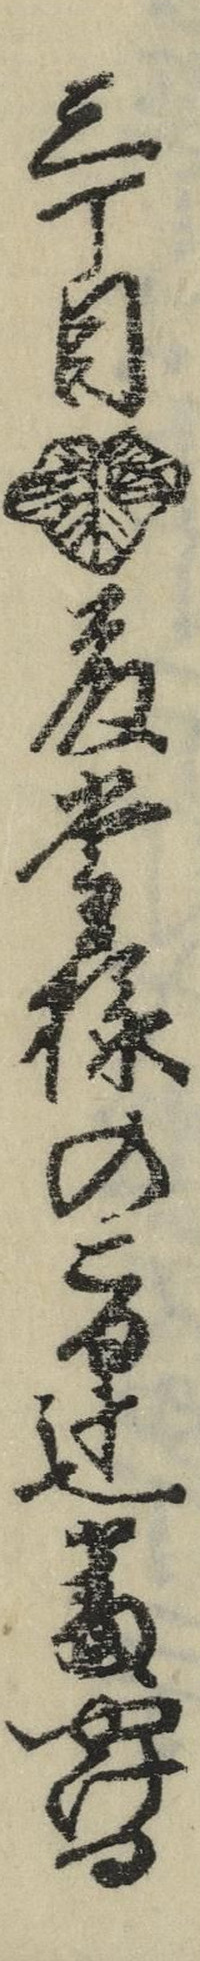三丁目藤堂様のこる辻番やける
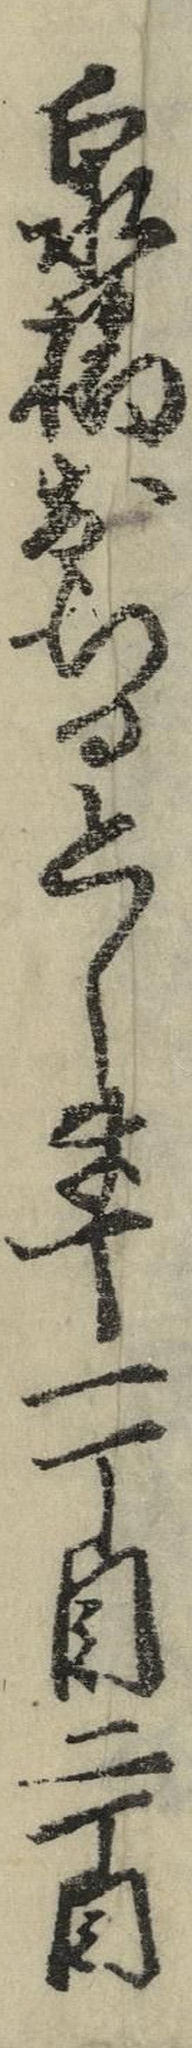泉橋おちるとしま丁一丁目二丁目
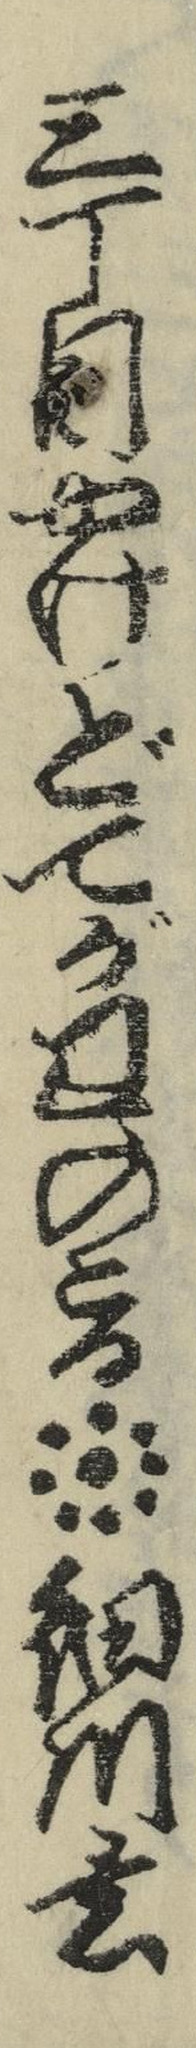三丁目やけどてがわのこる細川玄
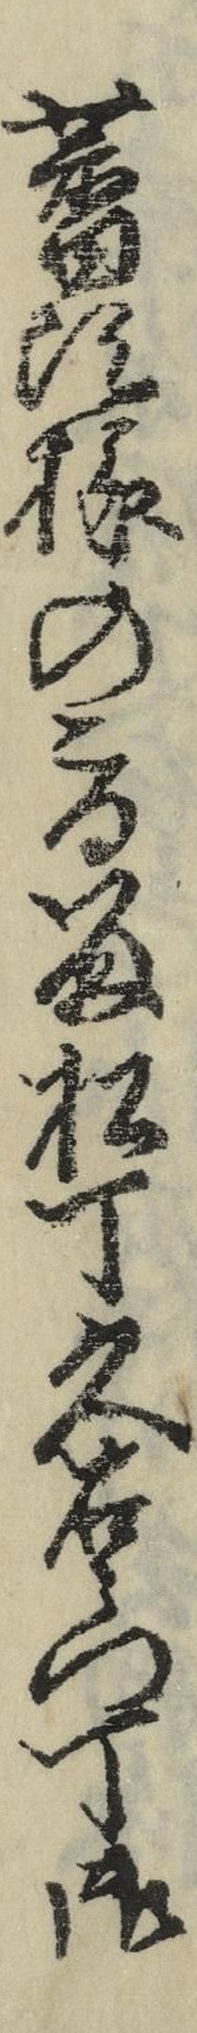蕃頭様のこる富松丁久右衛門丁御
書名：大江戸焼場所明細之写　附出火方角画圖　戊午安政五年十一月十五日
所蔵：東京大学地震研究所図書室 Earthquake Research Institute Library, The University of Tokyo, JAPAN
